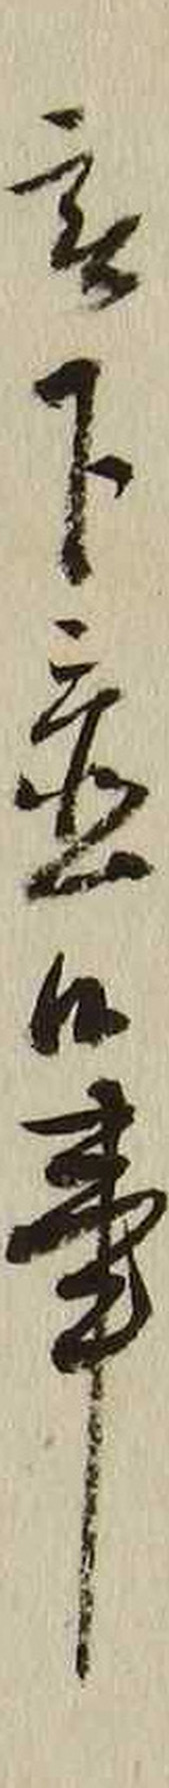被下置候事
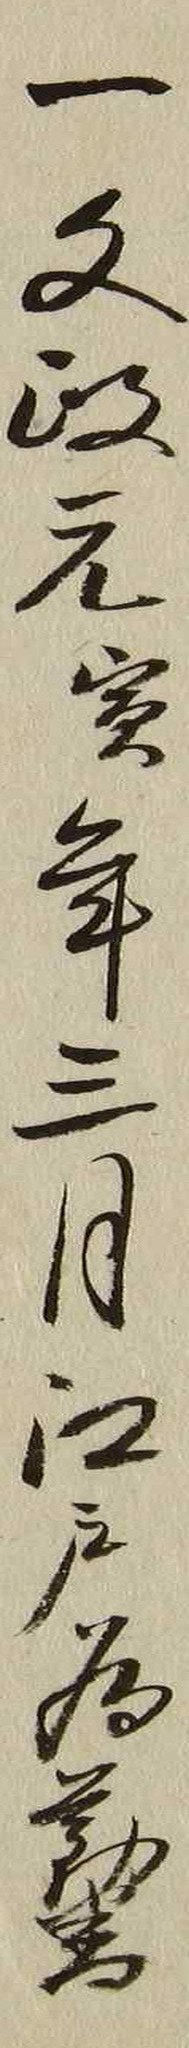一文政元寅年三月江戸為勤番
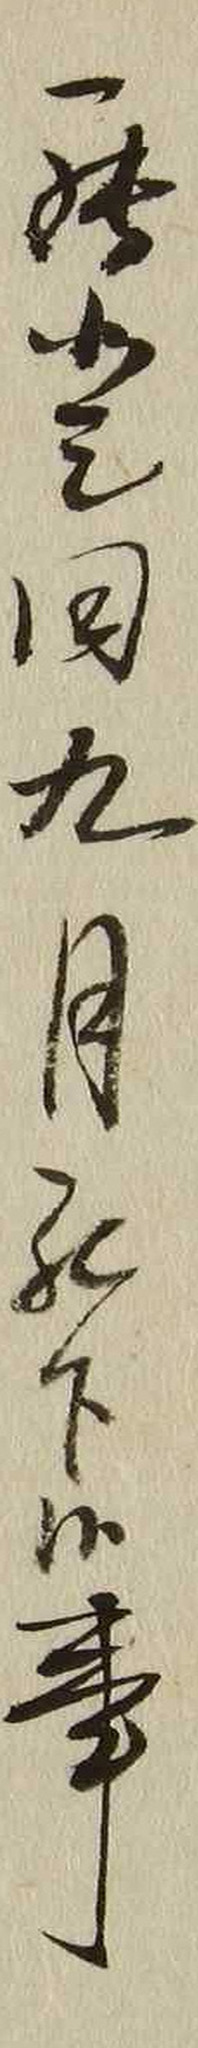罷登同九月罷下候事
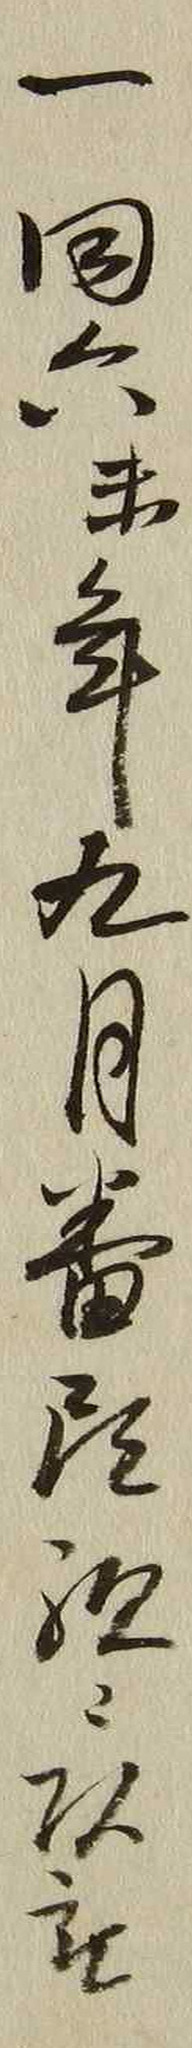一同六未年九月番頭組々頭被
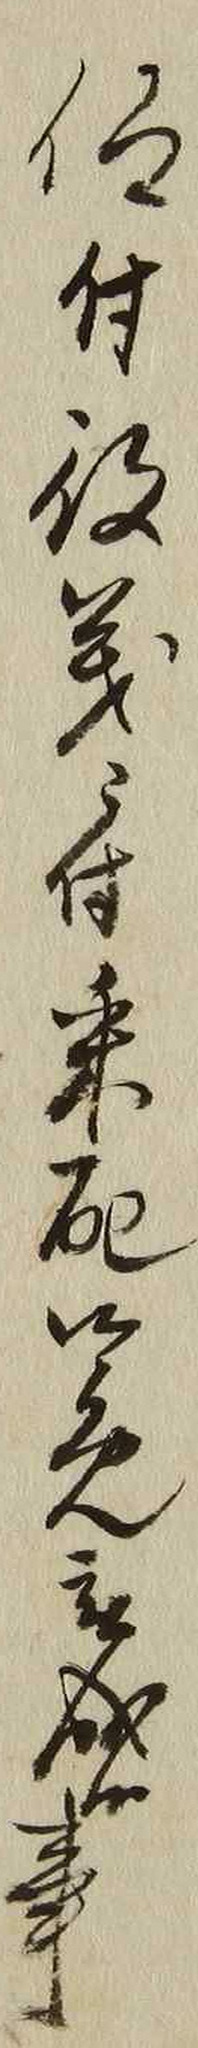仰付役義ニ付采配御免被成候事
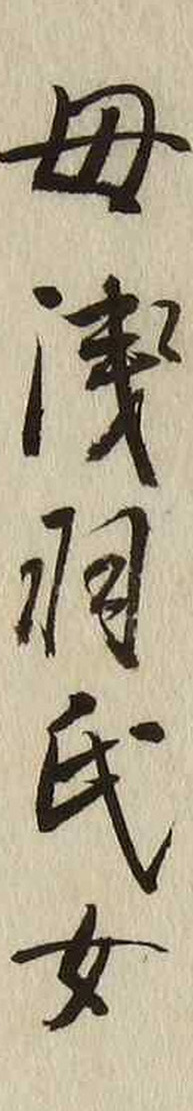母浅羽氏女
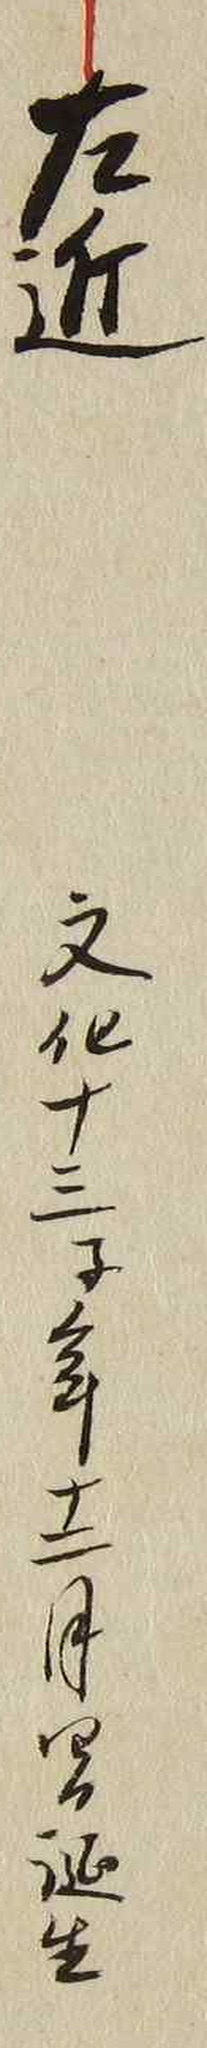左近文化十三子年十二月四日誕生
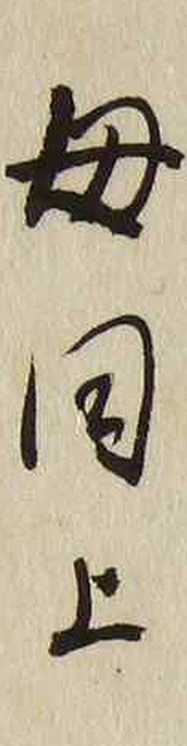母同上
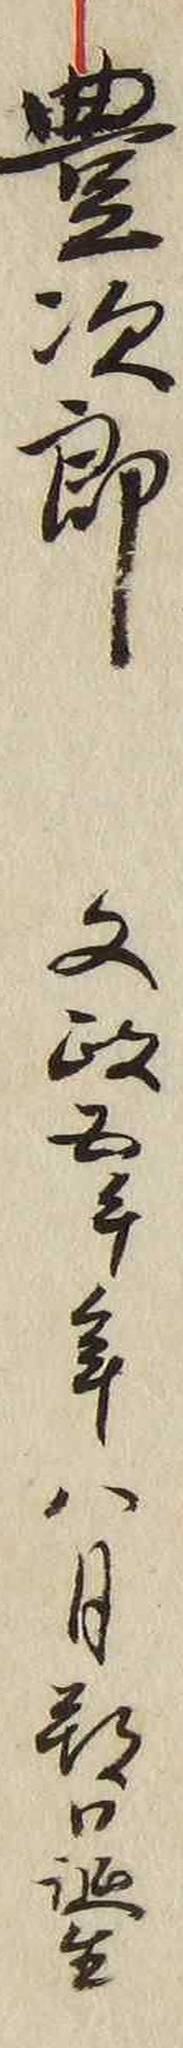豊次郎文政五午年八月朔日誕生

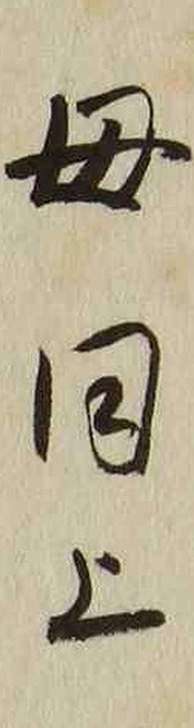母同上
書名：諸士系譜　巻之355　す之部5
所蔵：会津若松市立会津図書館
